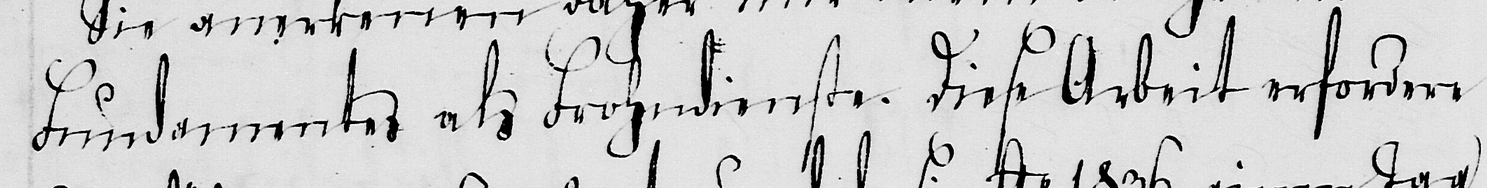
Fundamentes als Frohndienste. Diese Arbeit erfordere
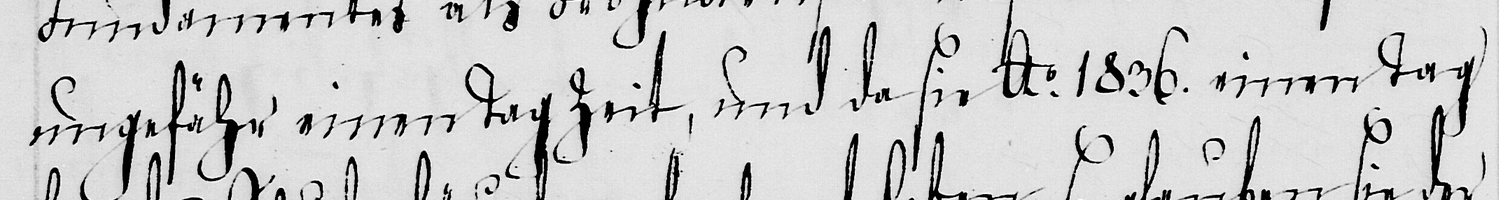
ungefähr einen Tag Zeit, und da sie Ao. 1836. einen Tag
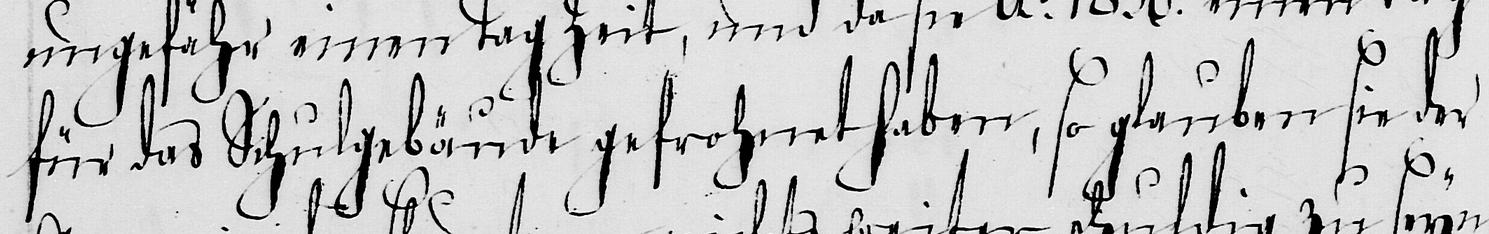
für das Schulgebäude gefrohnet haben, so glauben sie der
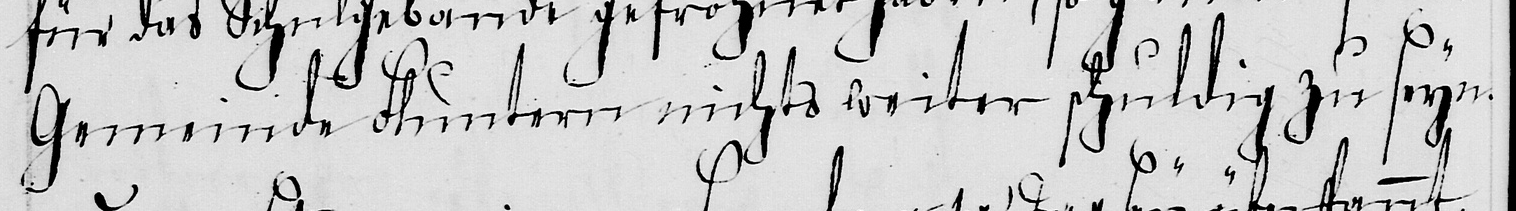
Gemeinde Fluntern nichts weiter schuldig zu seyn.
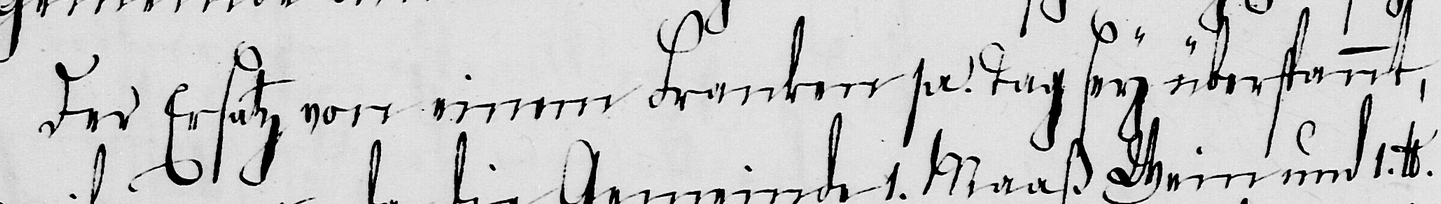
Der Ersatz von einem Franken pr. Tag sey überspannt,
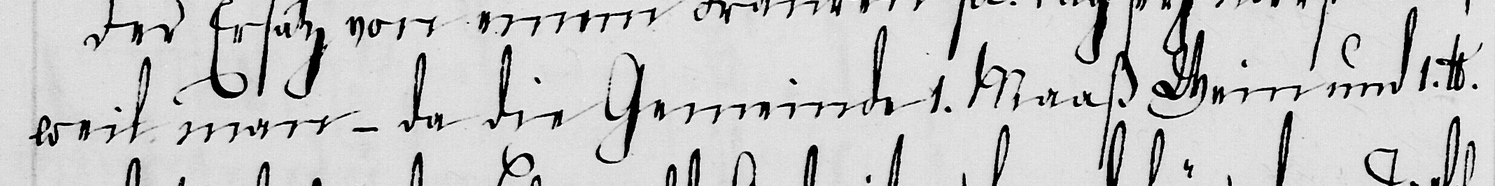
weil man – da die Gemeinde 1. Maaß Wein und 1.
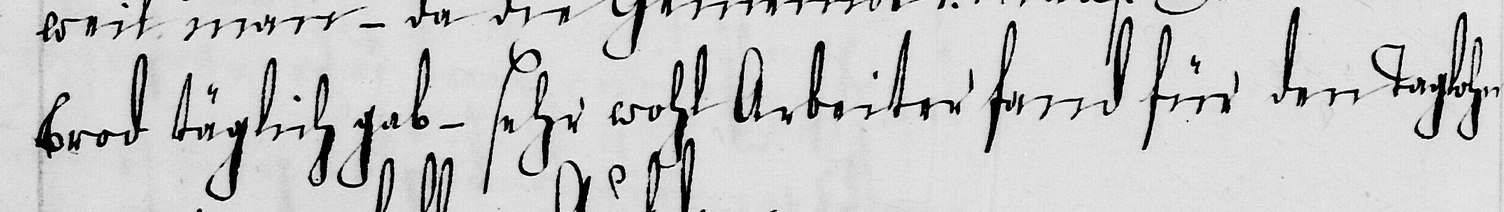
Brod täglich gab – sehr wohl Arbeiter fand für den Taglohn
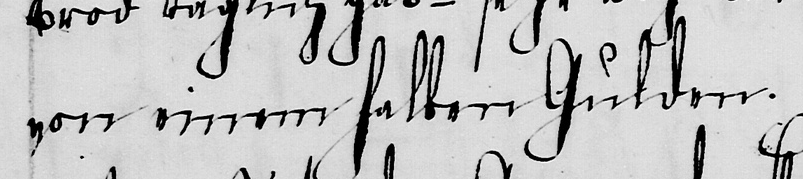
von einem halben Gulden.
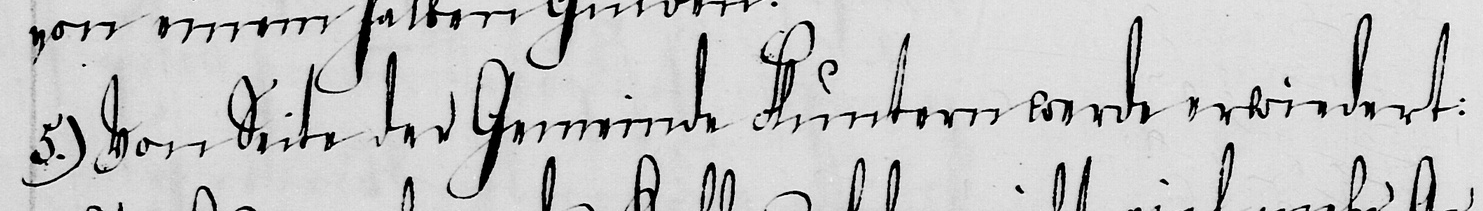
5.) Von Seite der Gemeinde Fluntern werde erwiedert:
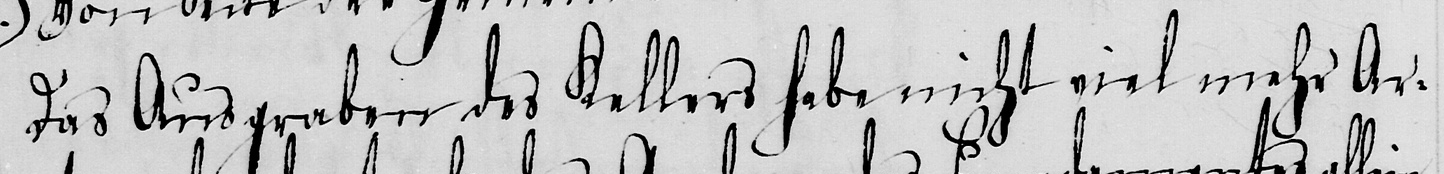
Das Ausgraben des Kellers habe nicht viel mehr Ar¬
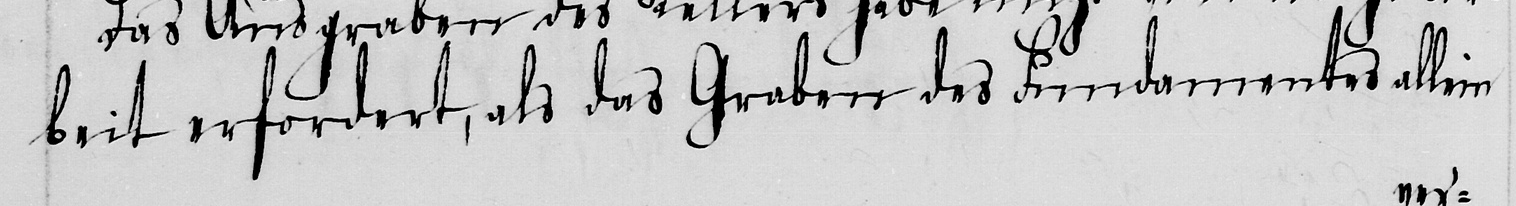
beit erfordert, als das Graben des Fundamentes alle¬
